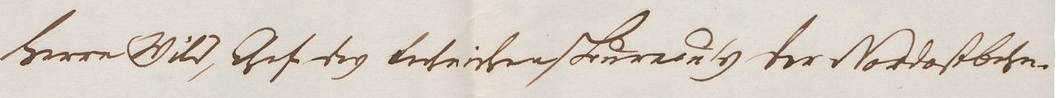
Herrn Wild, Chef des technischen Bureau's der Nordostbahn.
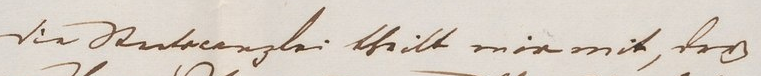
Die Staatscanzlei theilt mir mit, der
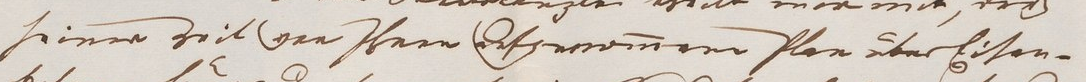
seiner Zeit von Ihnen aufgenommene Plan über Eisen-
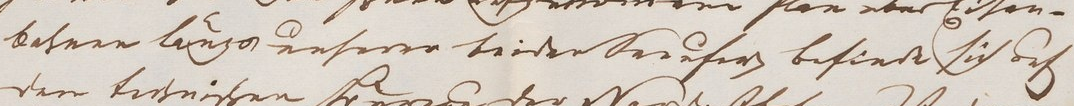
bahnen längs unserer beiden Seeufer befinde sich auf
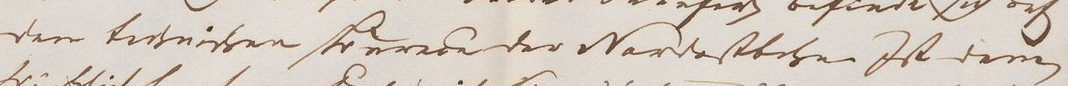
dem technischen Bureau der Nordostbahn. Ist dem
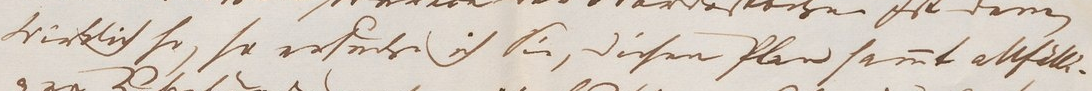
wirklich so, so ersuche ich Sie, diesen Plan sammt allfälli-
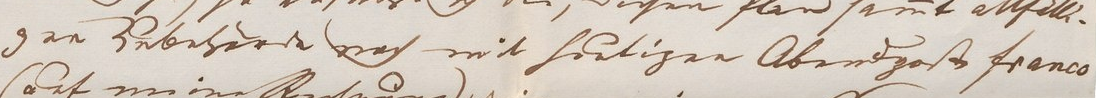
ger Zubehörde noch mit heutiger Abendpost franco
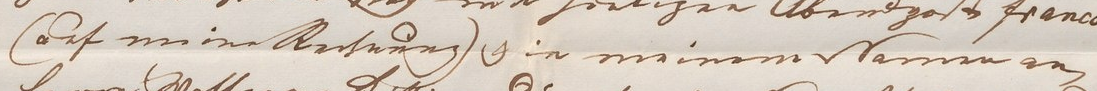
(auf meine Rechnung) & in meinem Namen an
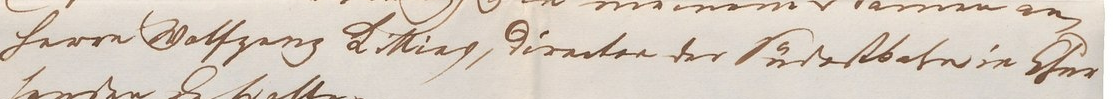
Herrn Wolfgang Killias, Director der Südostbahn in Chur
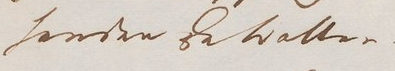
senden zu wollen.
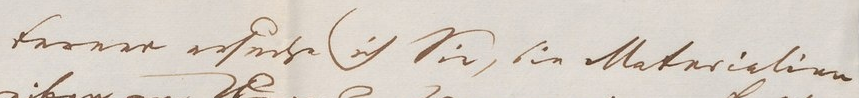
Ferner ersuche ich Sie, die Materialien
